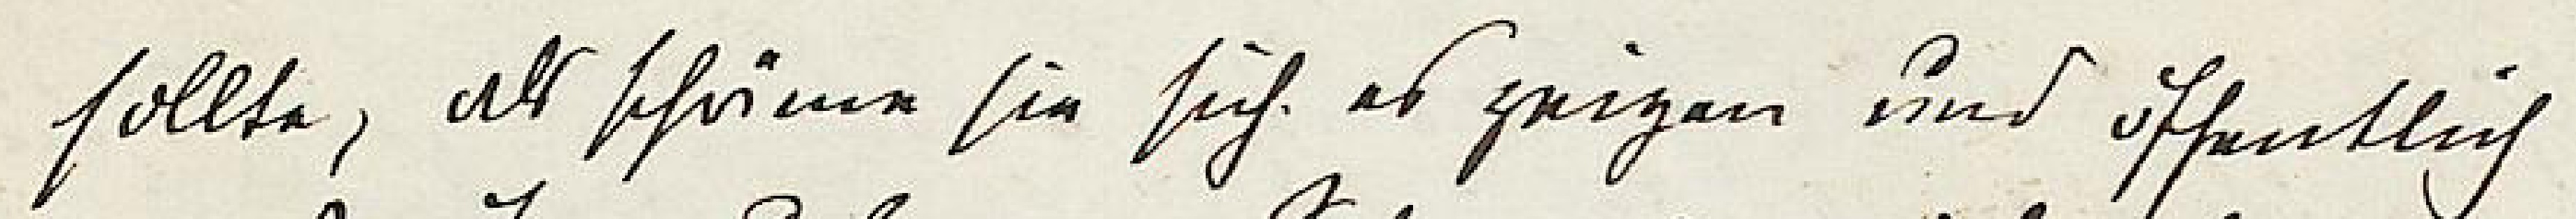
sollte, als schäme sie sich es zeigen und öffentlich
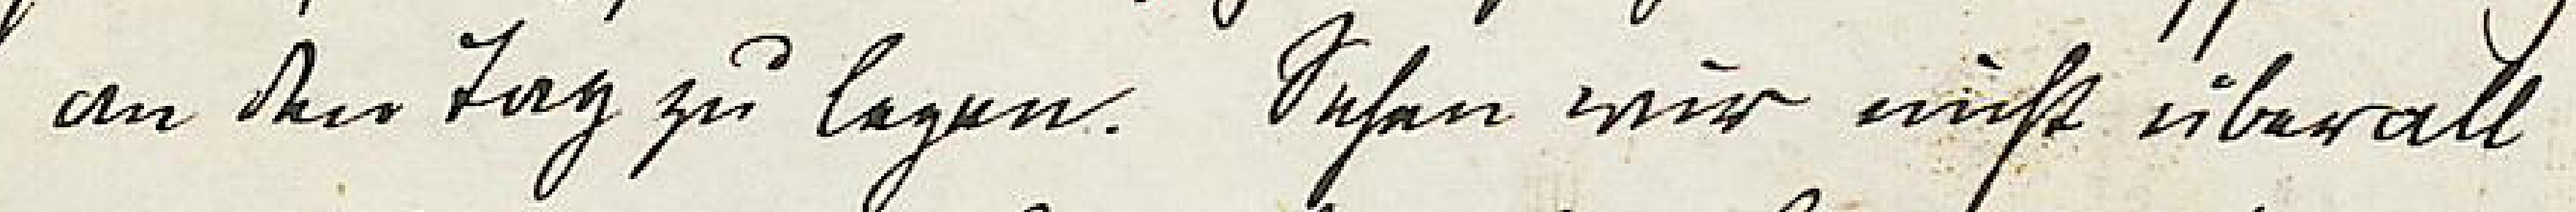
an den Tag zu legen. Sehen wir nicht überall
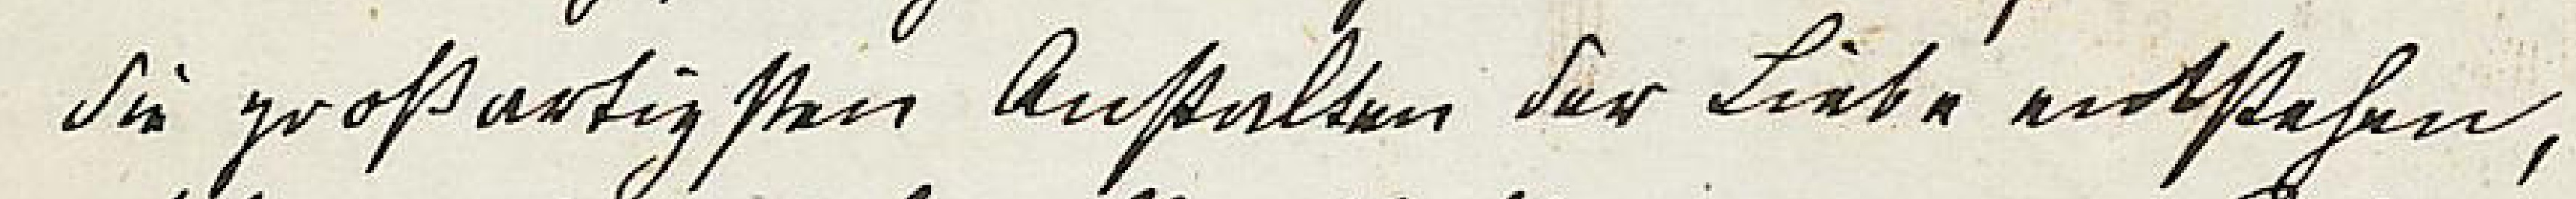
die großartigsten Anstalten der Liebe entstehen,
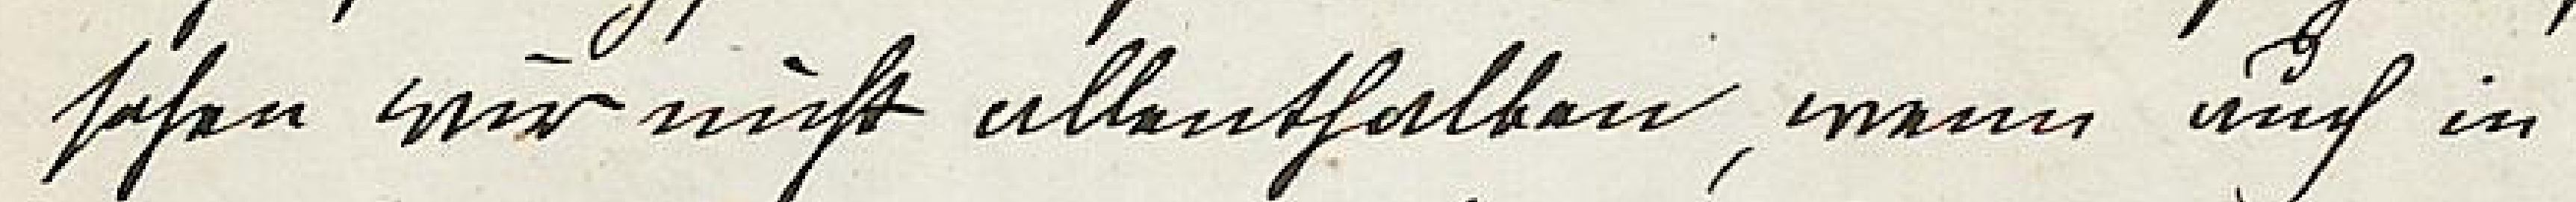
sehen wir nicht allenthalben, wenn auch in
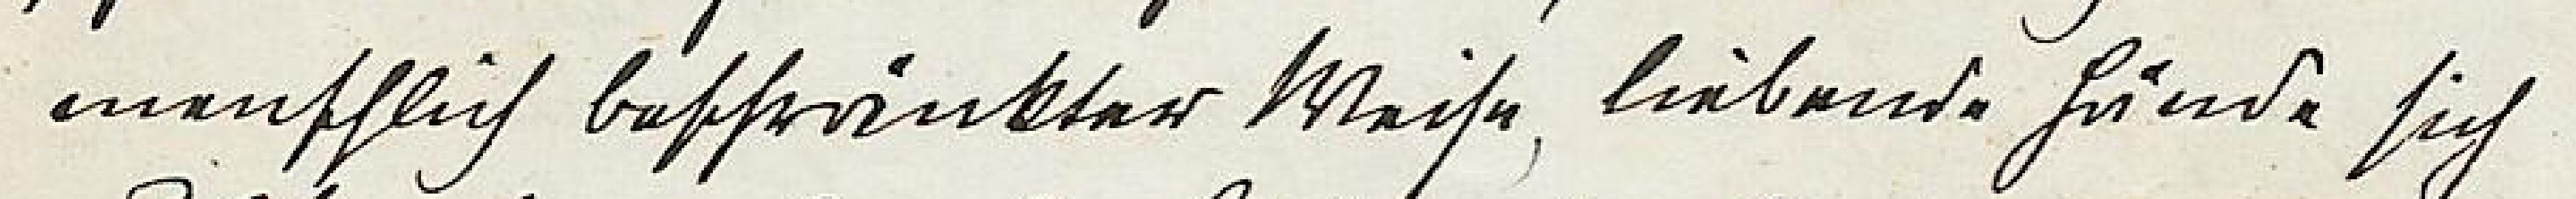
menschlich beschränkter Weise, liebende Hände sich
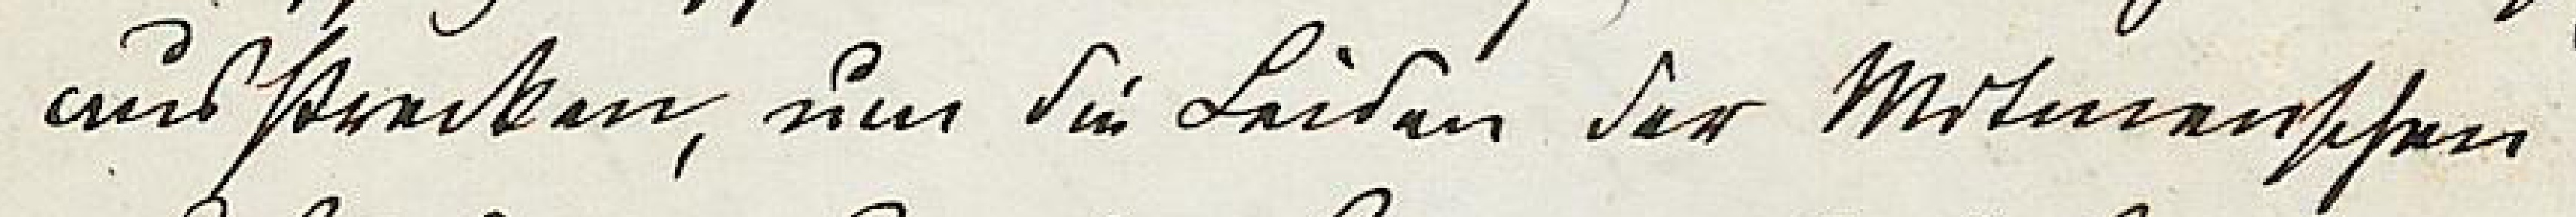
ausstrecken, um die Leiden der Mitmenschen
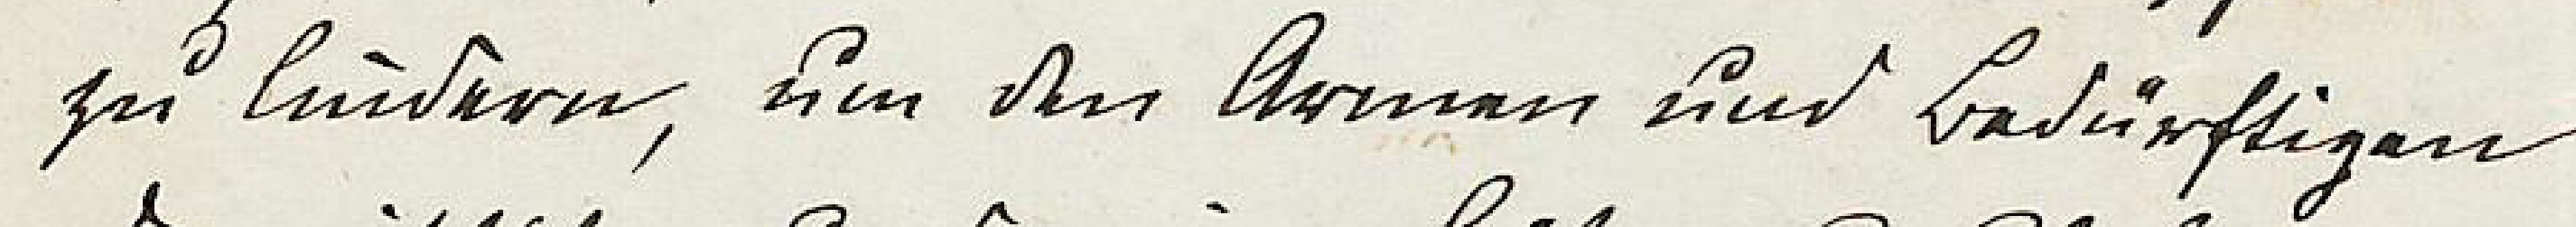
zu lindern, um den Armen und Bedürftigen
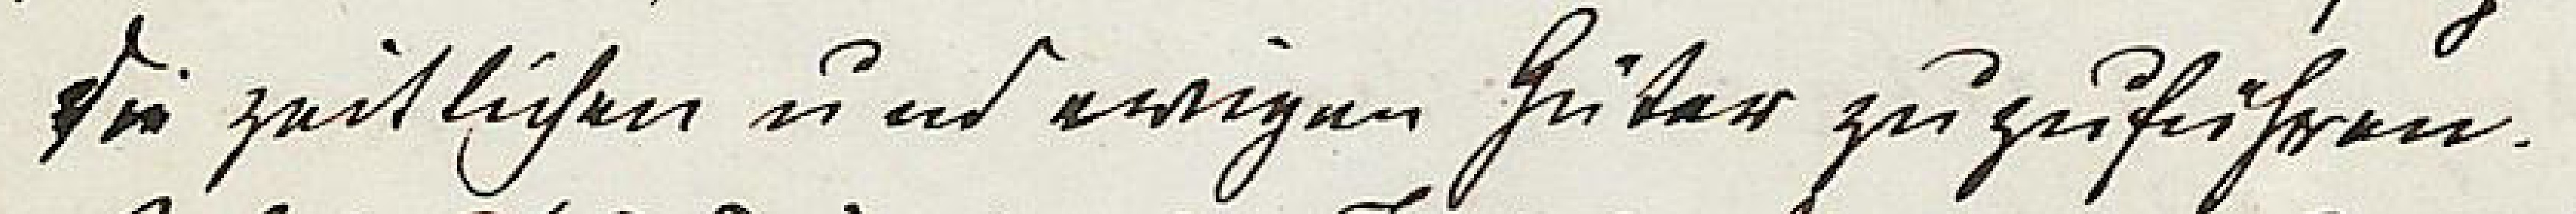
die zeitlichen und ewigen Güter zuzuführen.
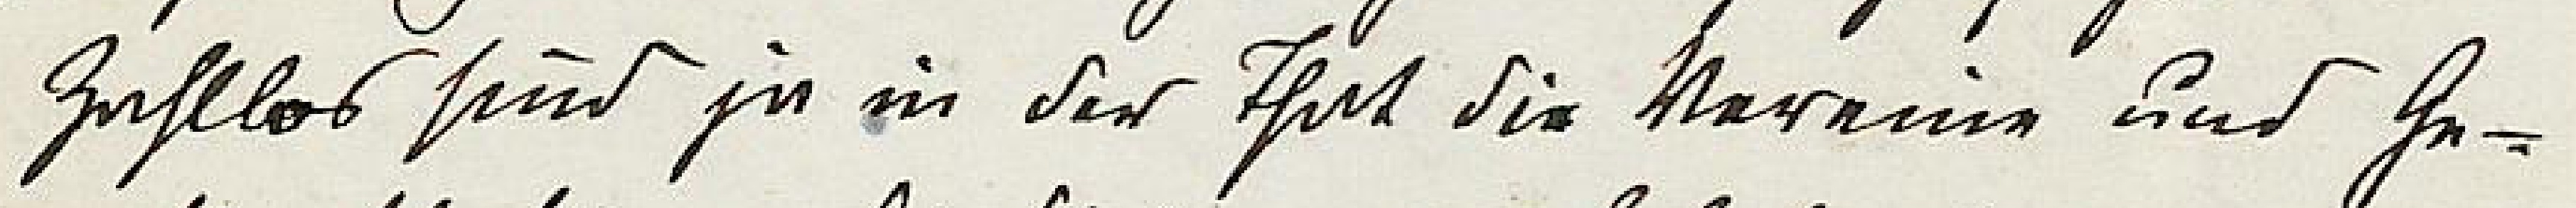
Zahlos sind ja in der That die Vereine und Ge¬
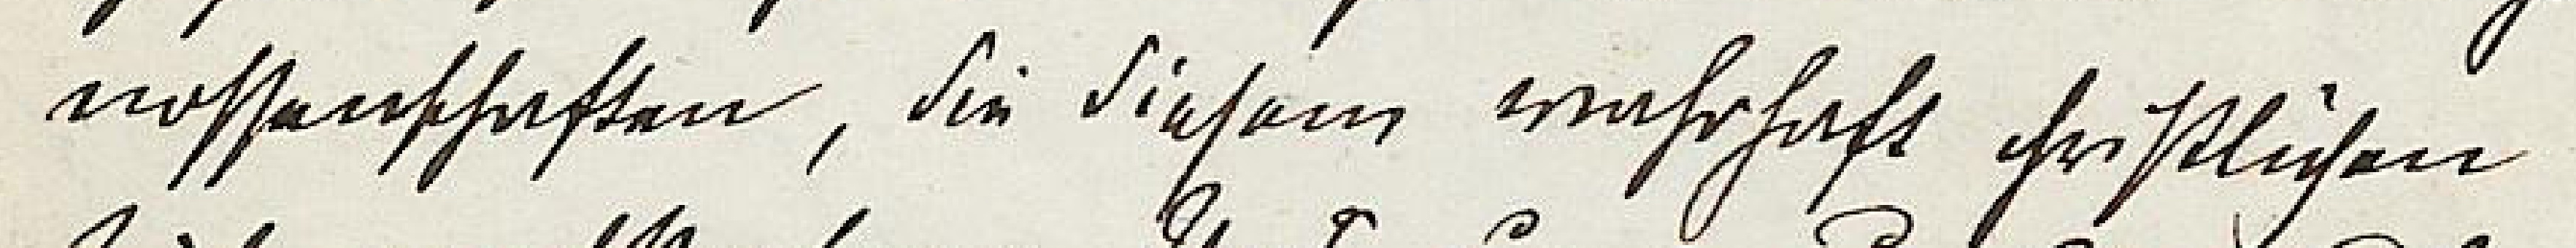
nossenschaften, die diesem wahrhaft christlichen
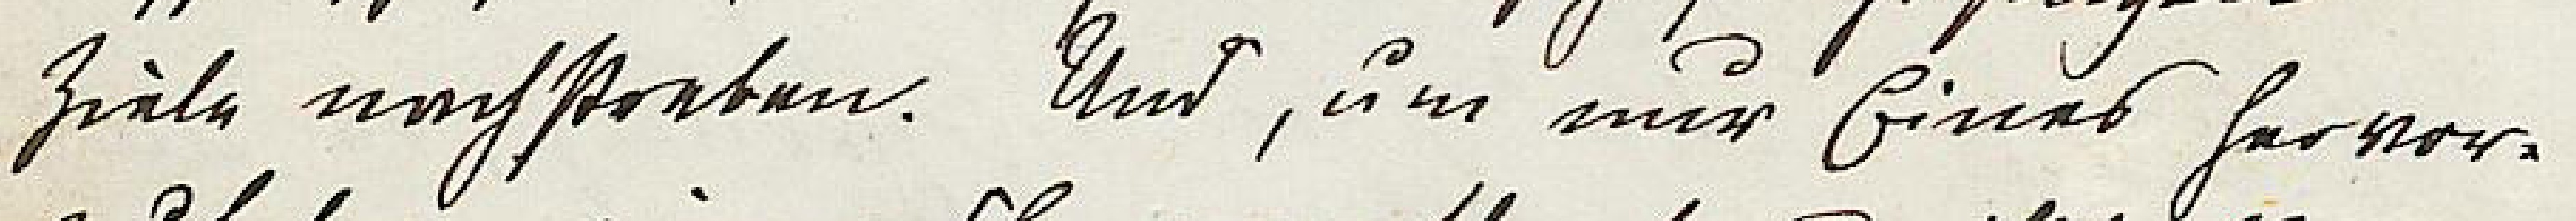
Ziele nachstreben. Und, um nur Eines hervor¬
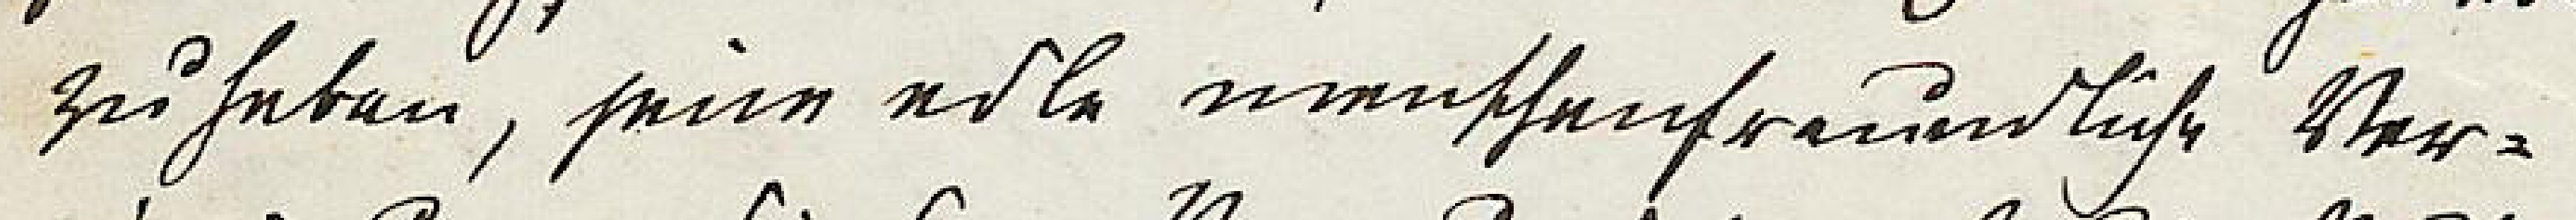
zuheben, seine edle menschenfreundliche Ver¬
